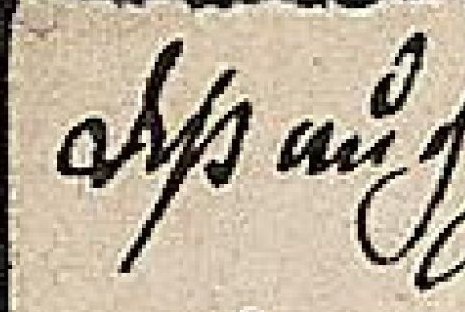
daß auch
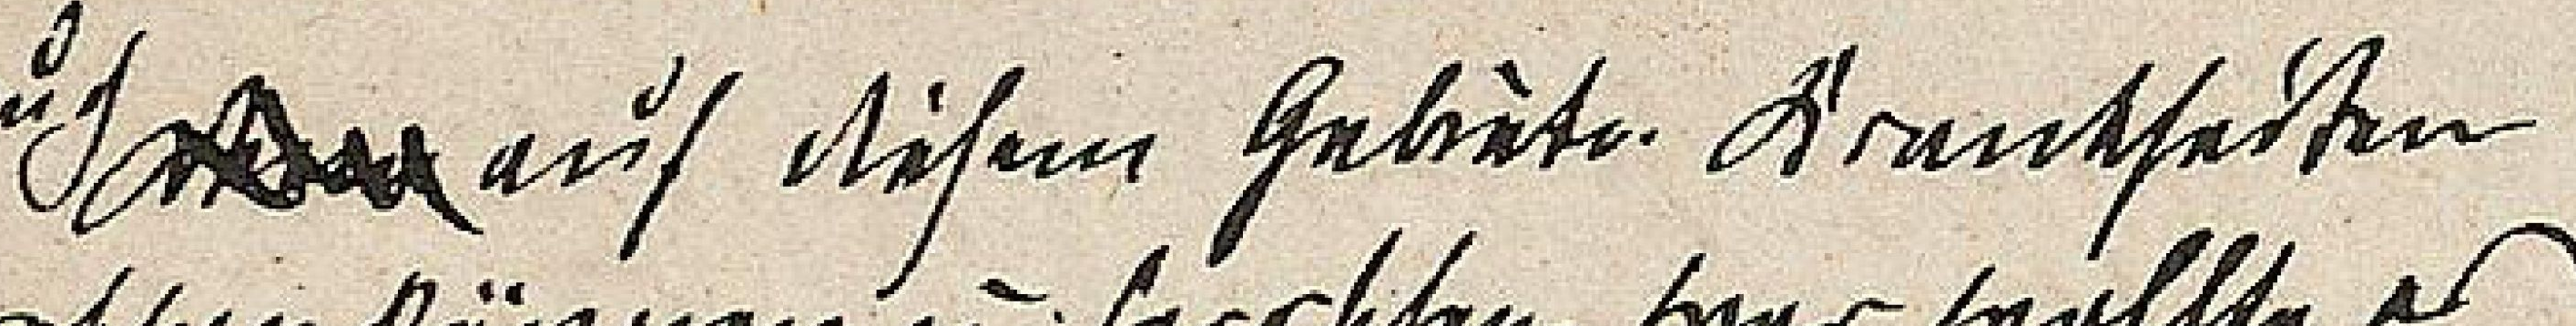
Denn auf diesem Gebiete. Krankheiten
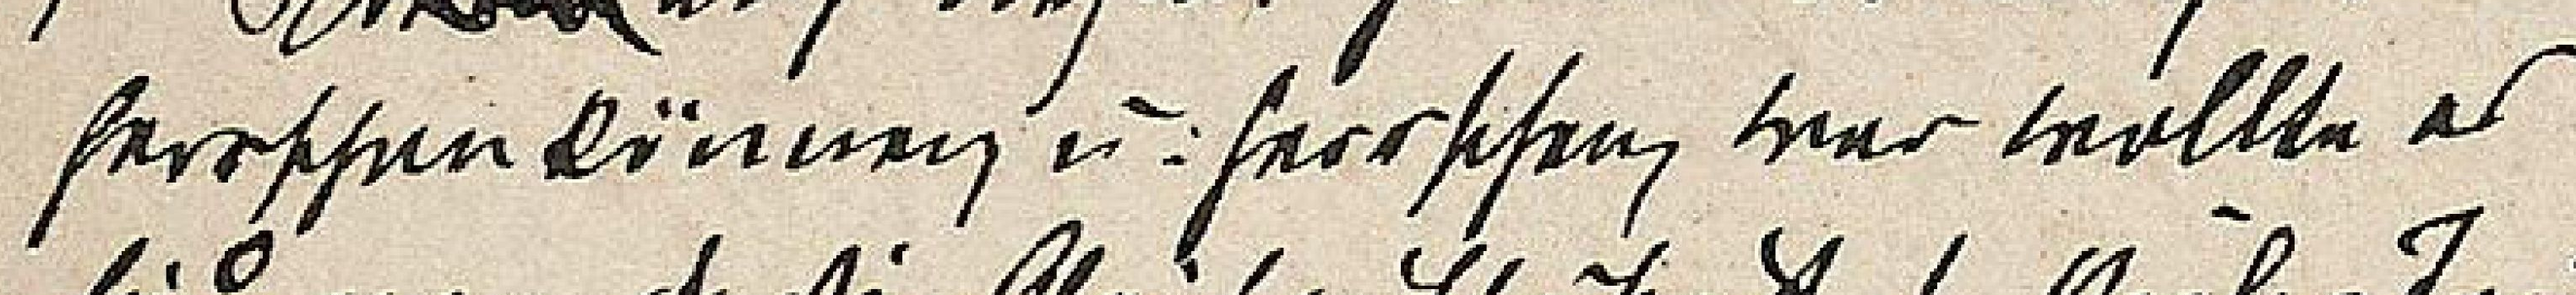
herrschen können, u. herrschen, wer wollte es
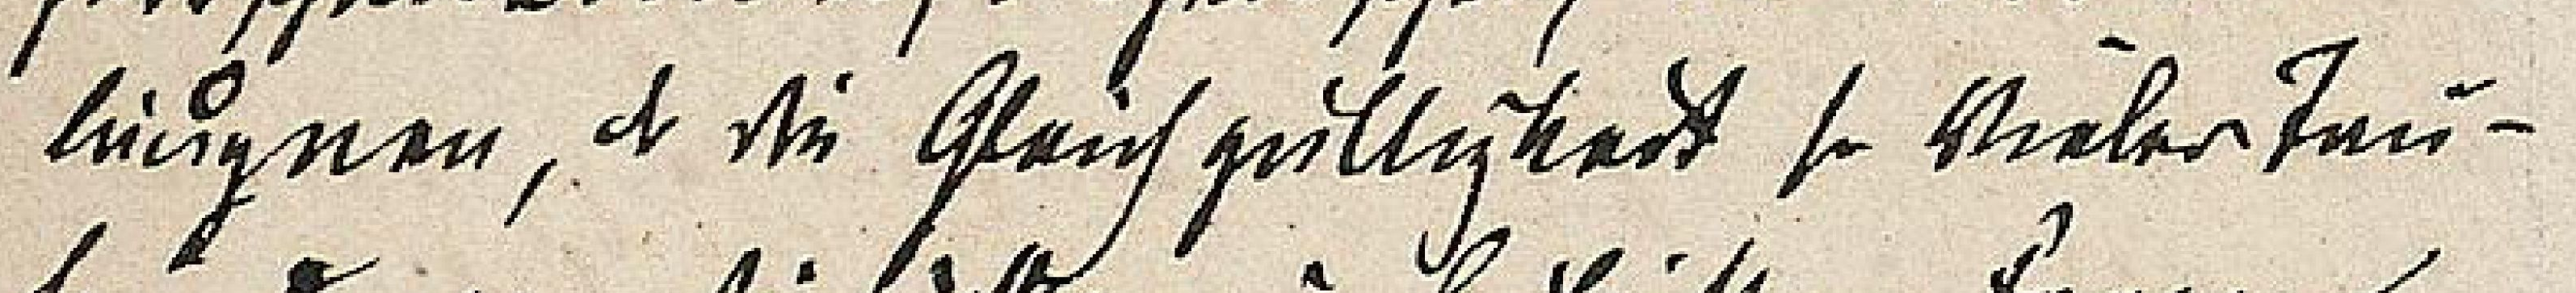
leugnen, da die Gleichgültigkeit so Vieler Tau¬
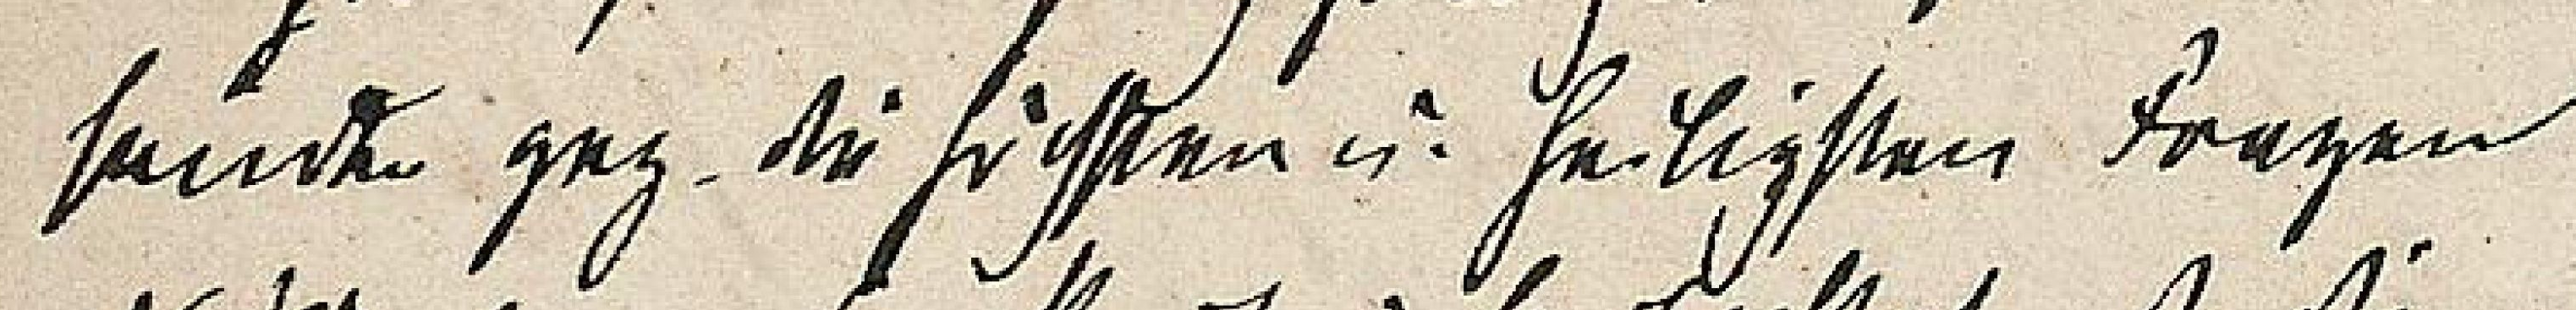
sende geg. die höchsten u. heiligsten Fragen
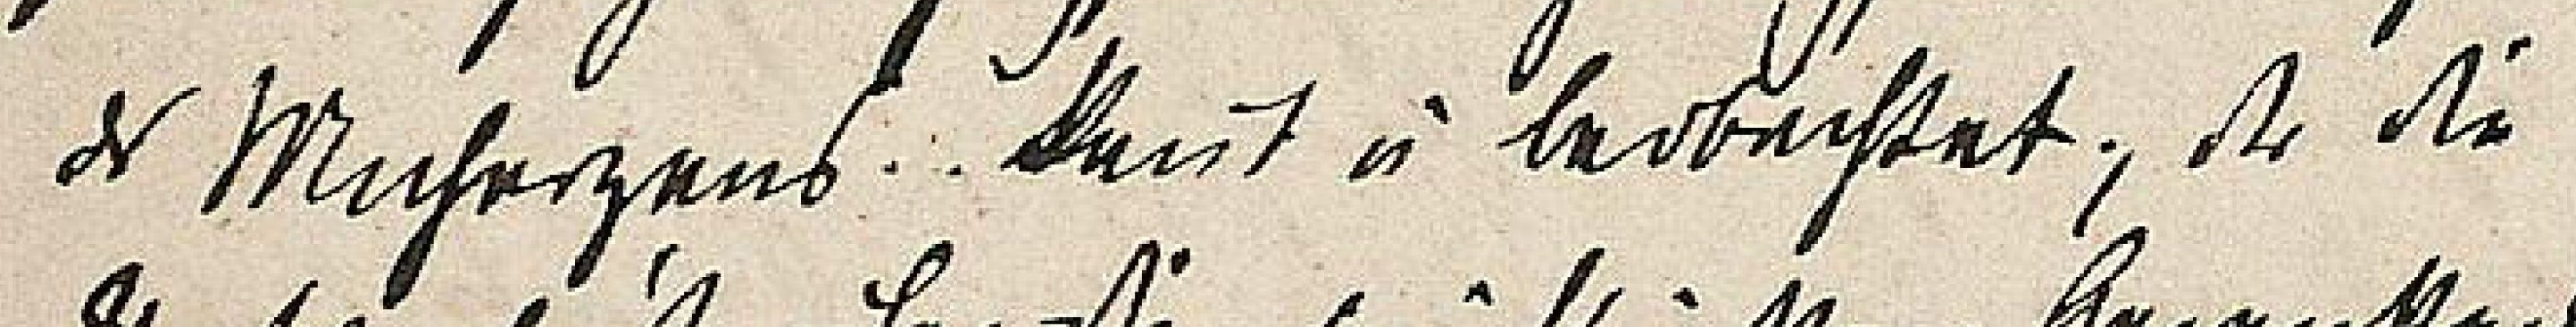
ds Mnherzens kent u. beobachtet., der die
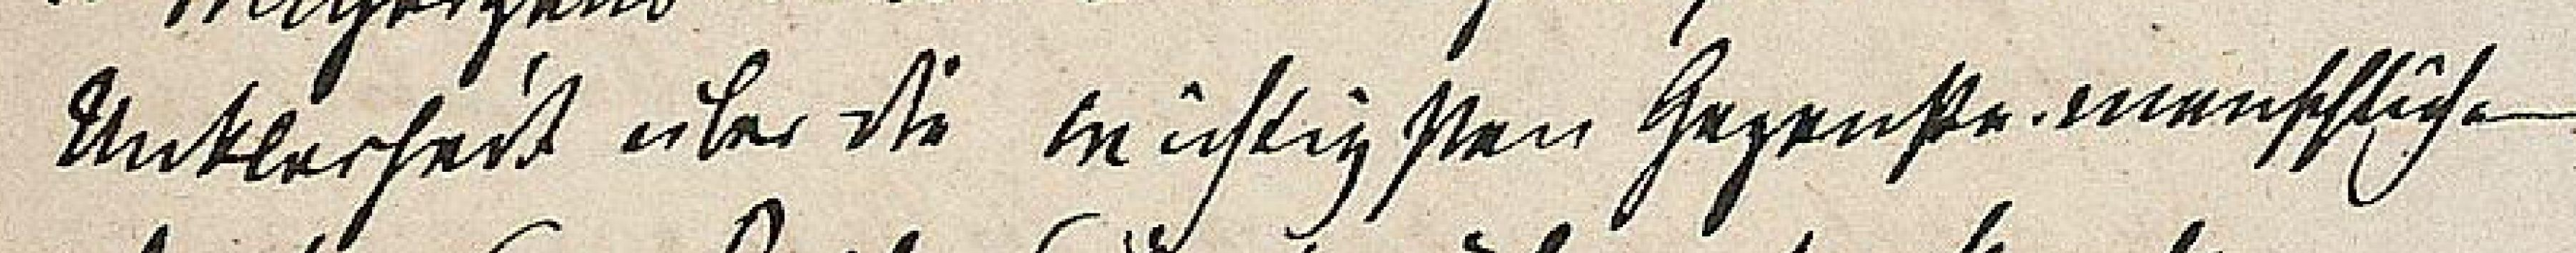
Unklarheit über die wichtigsten Gegenste. menschlichen
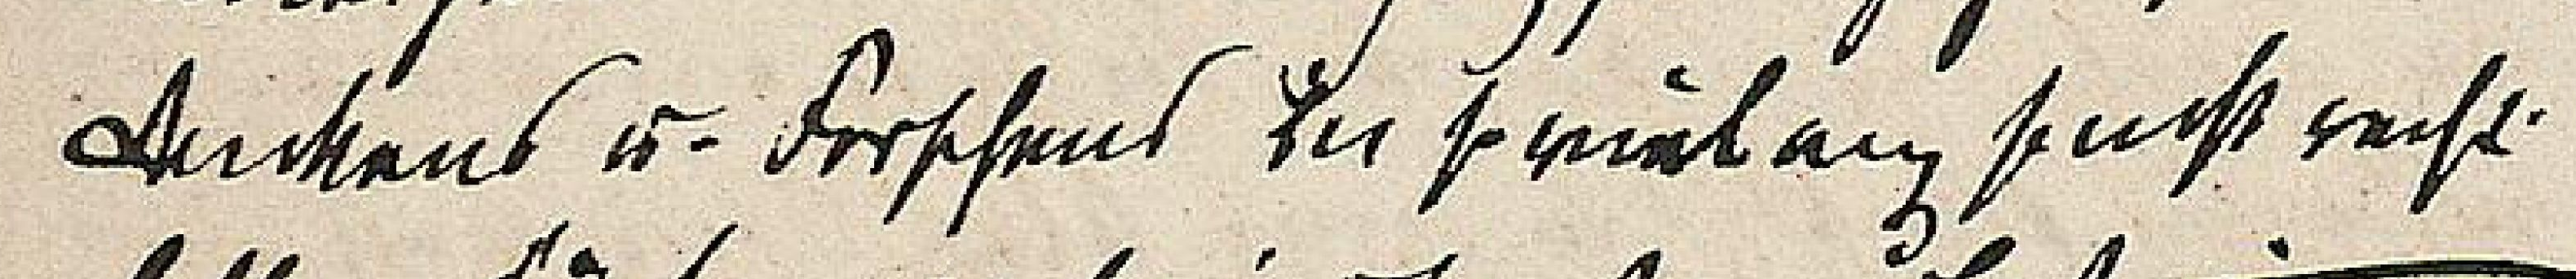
Dankens u. Forschens zu so vielen, sonst recht
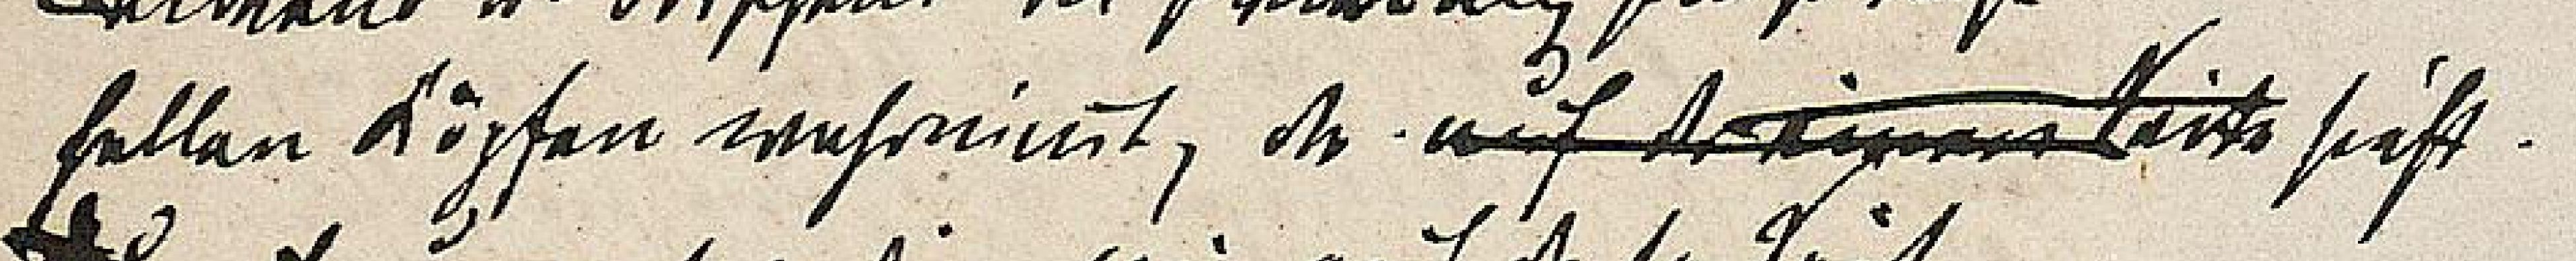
hellen Köpfen wahrnimt, der auf der eigenen Seite sieht.
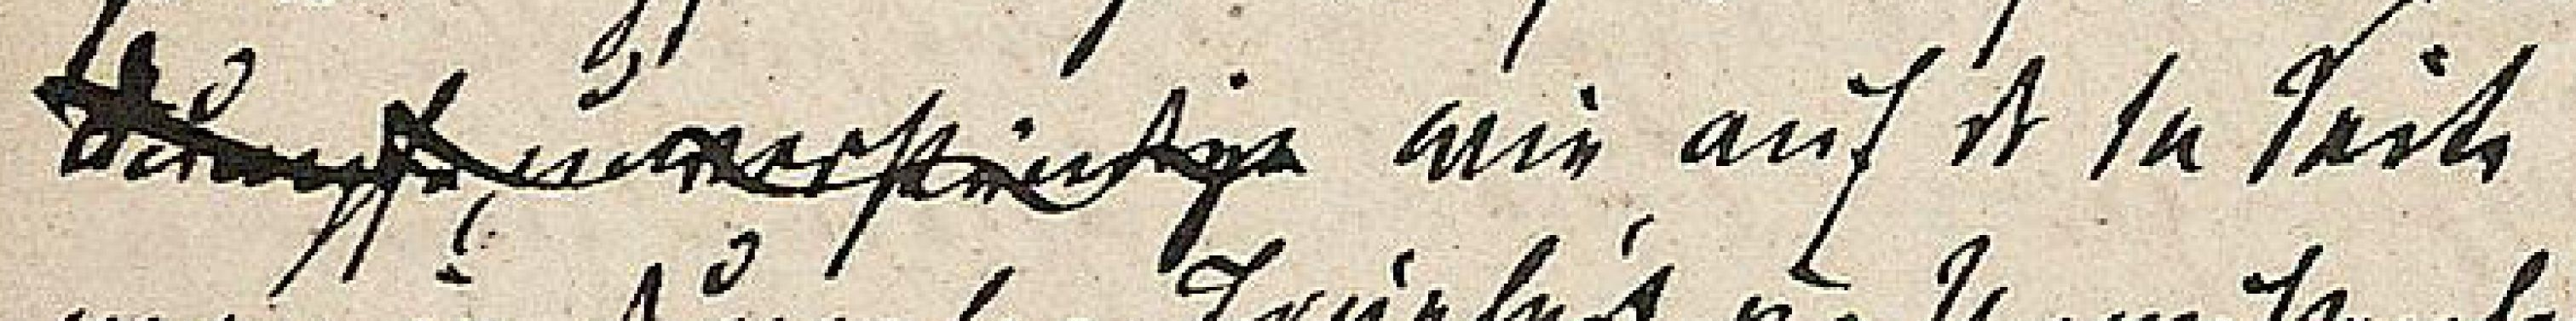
dumpe, unverständige wie auf dr 1n Seite
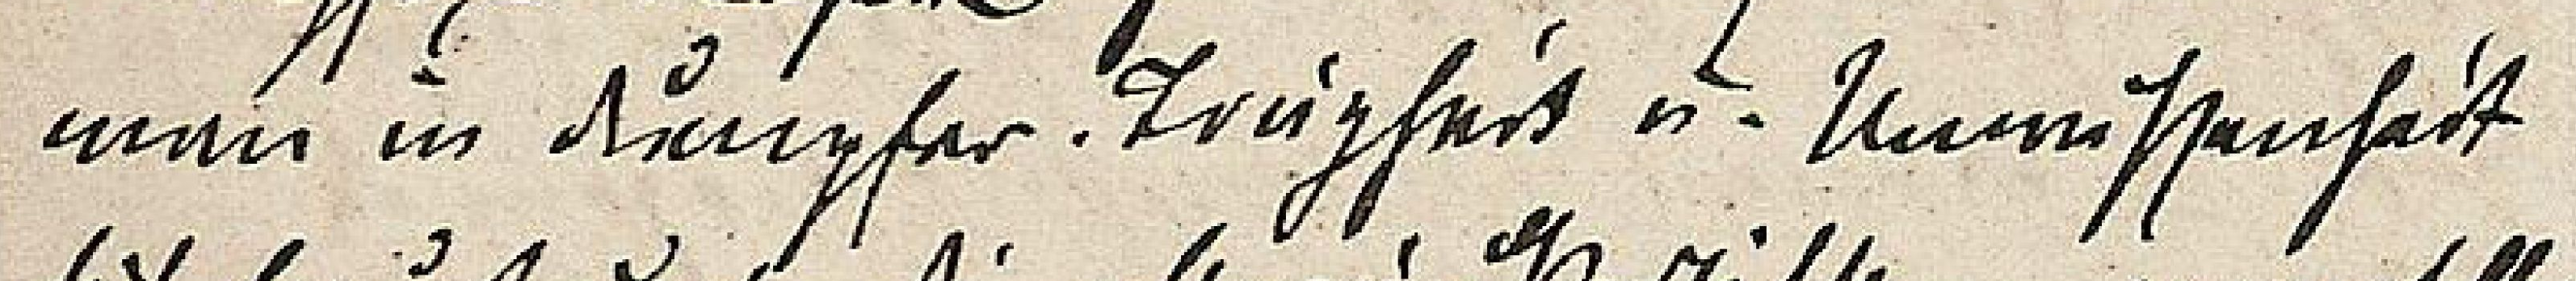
man in dumpfer Trägheit u. Unwissenheit
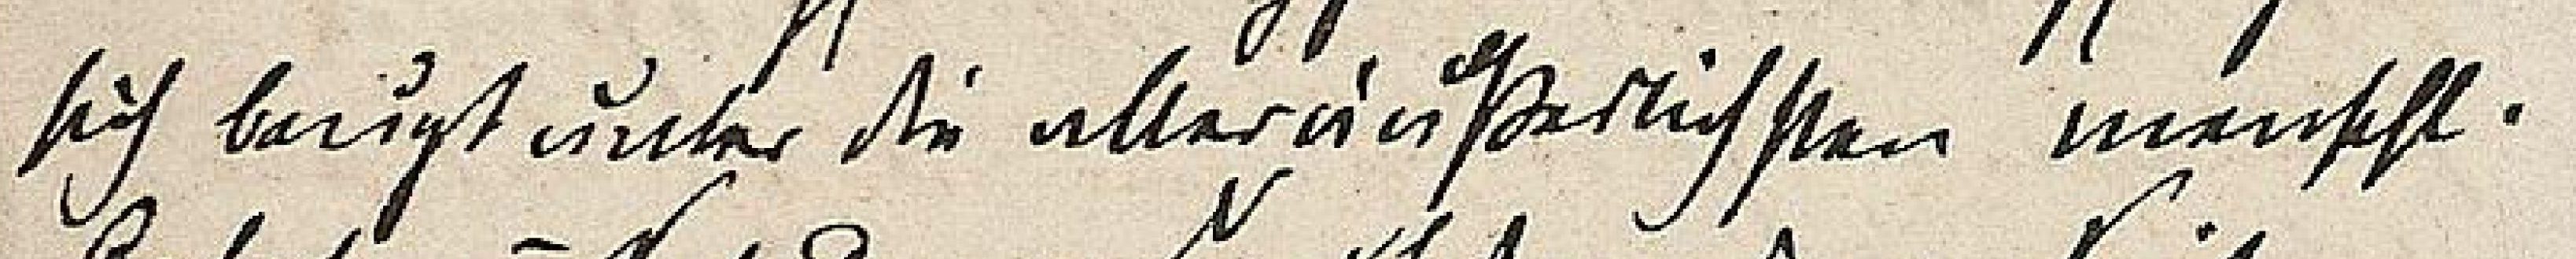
sich beugt unter die alleräußerlichsten menschl.
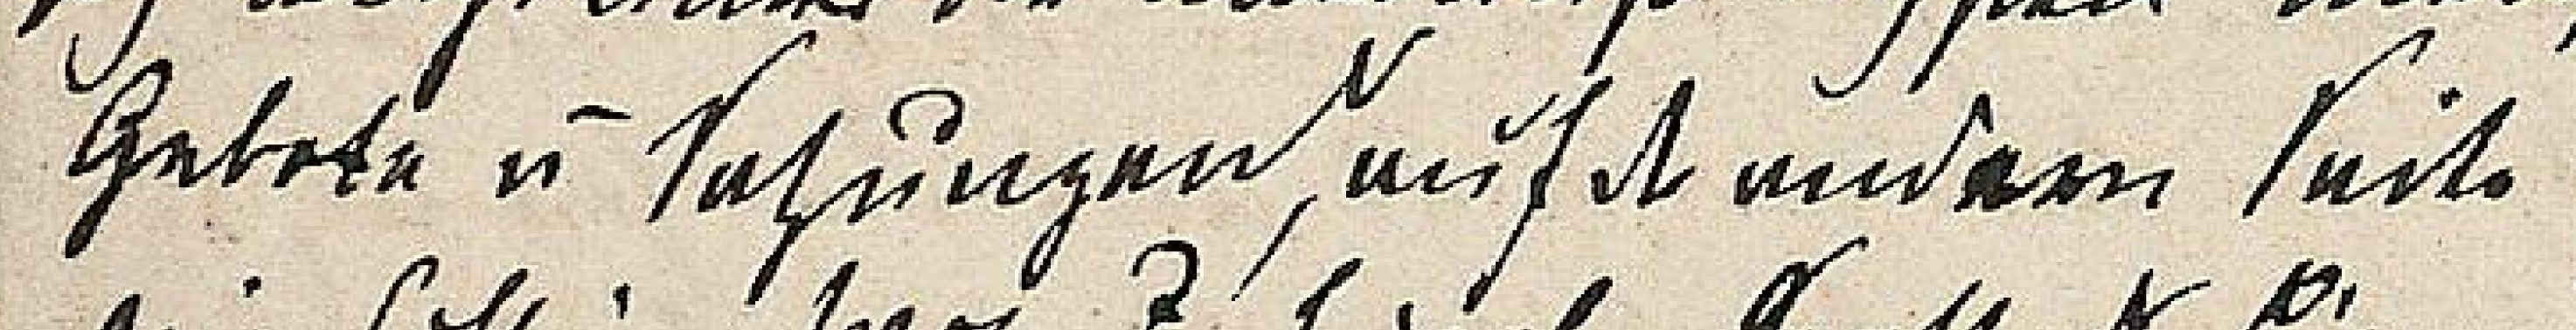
Gebote u Satzungen V auf der andern Seite
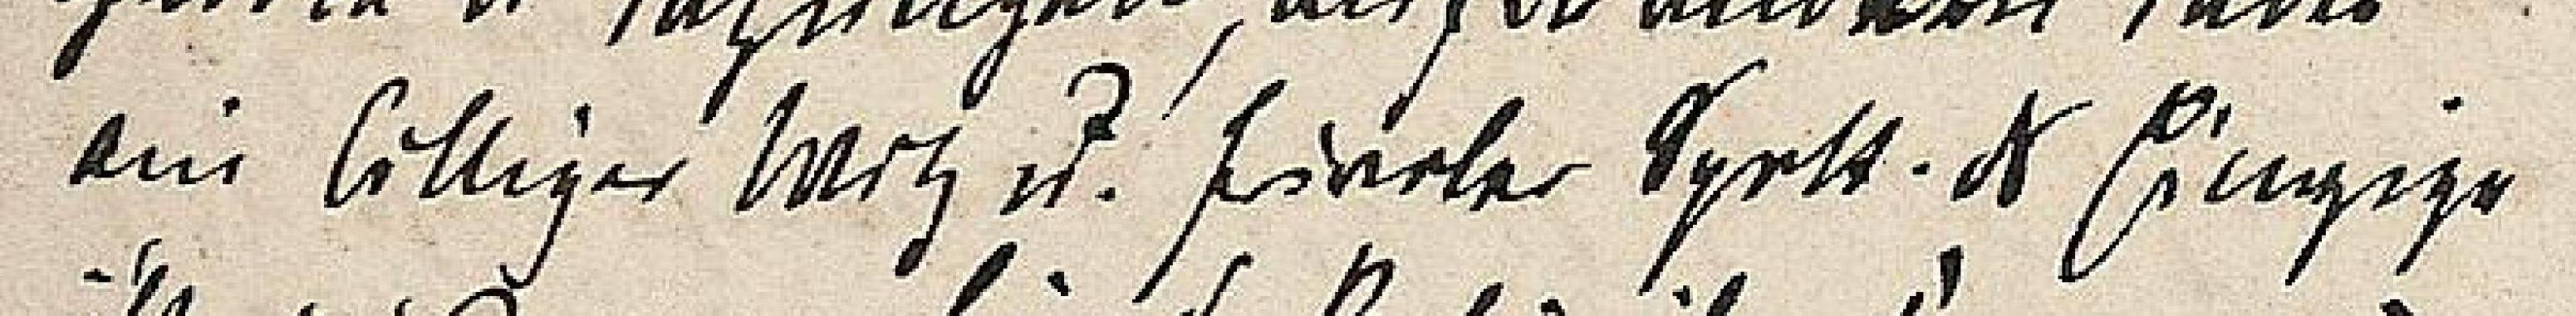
ein billiger Witz u. frivoler Spott ds Einzige
